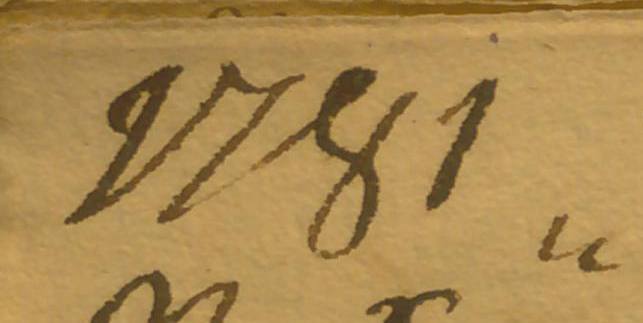1781
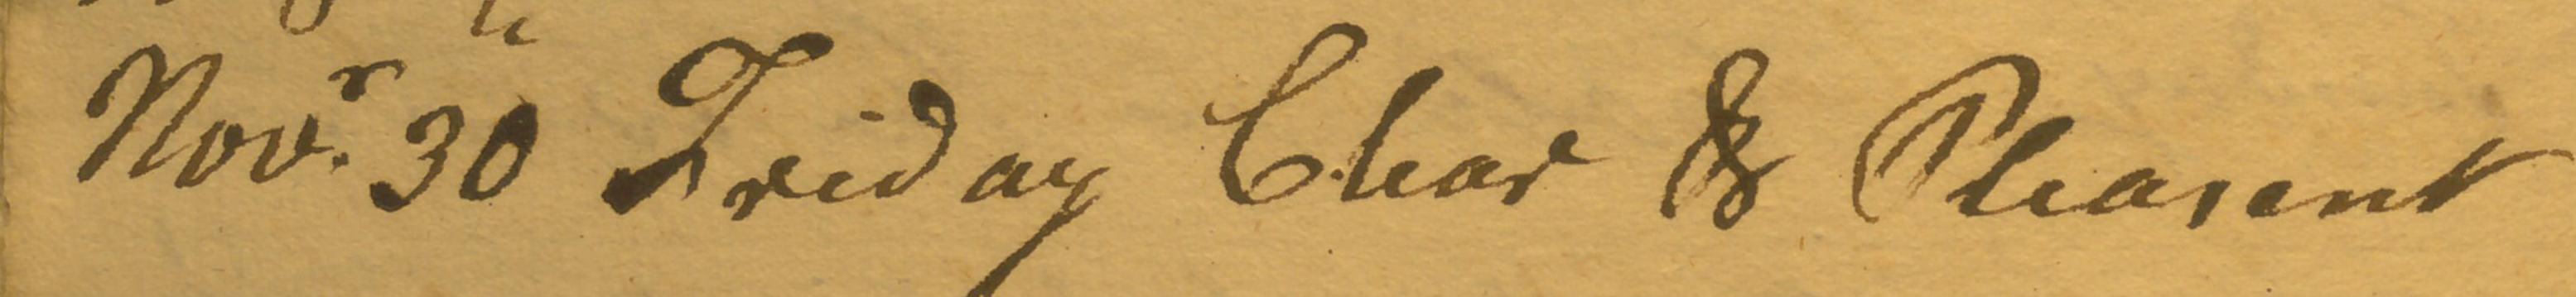Nov^r. 30 Friday Clear & Pleasent
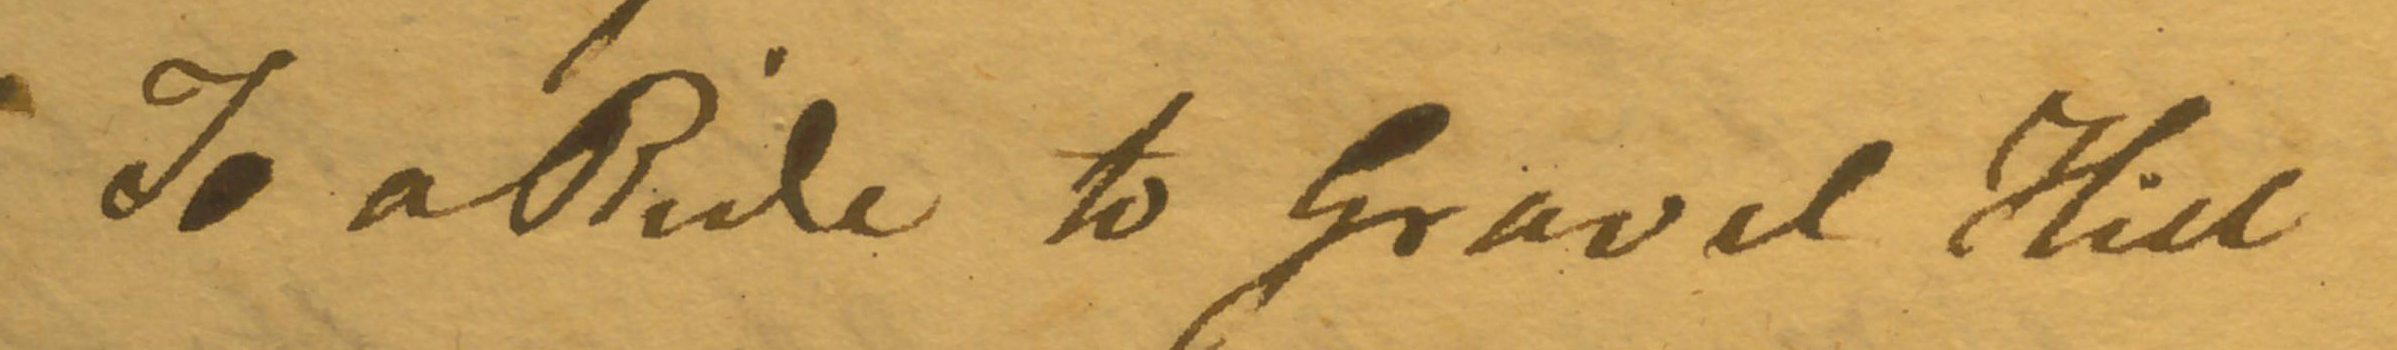To a Ride to Gravel Heel
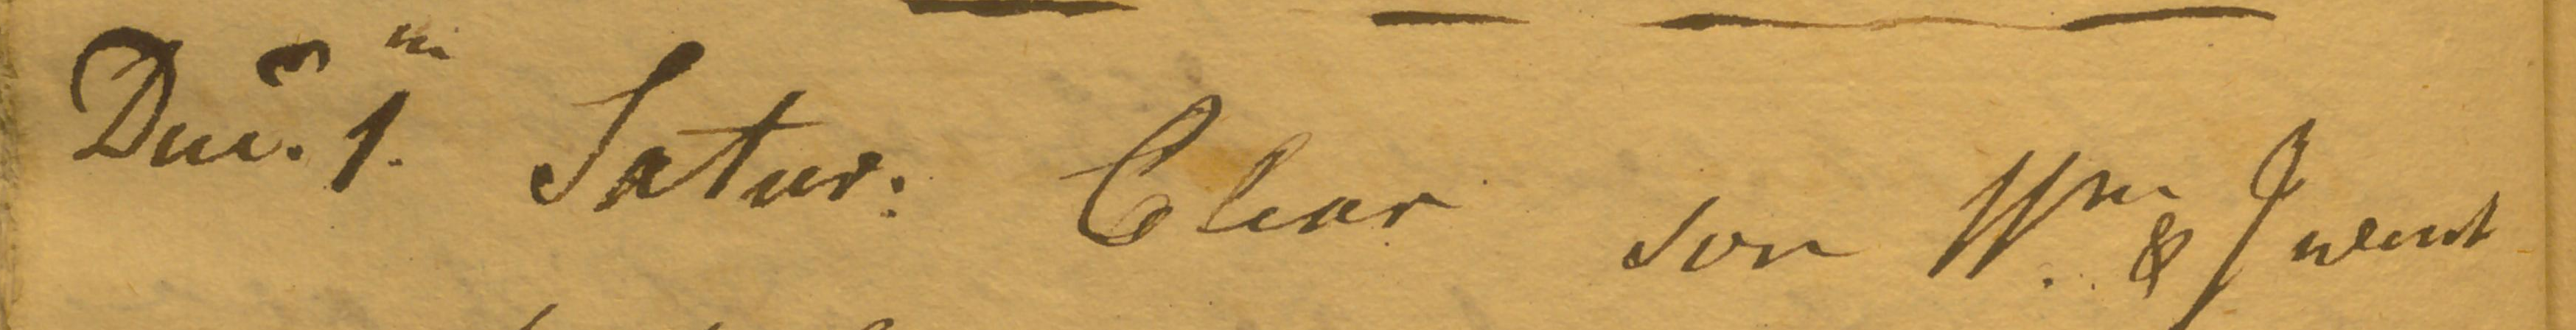Dece^. 1. Satur: Clear son W^m & I went
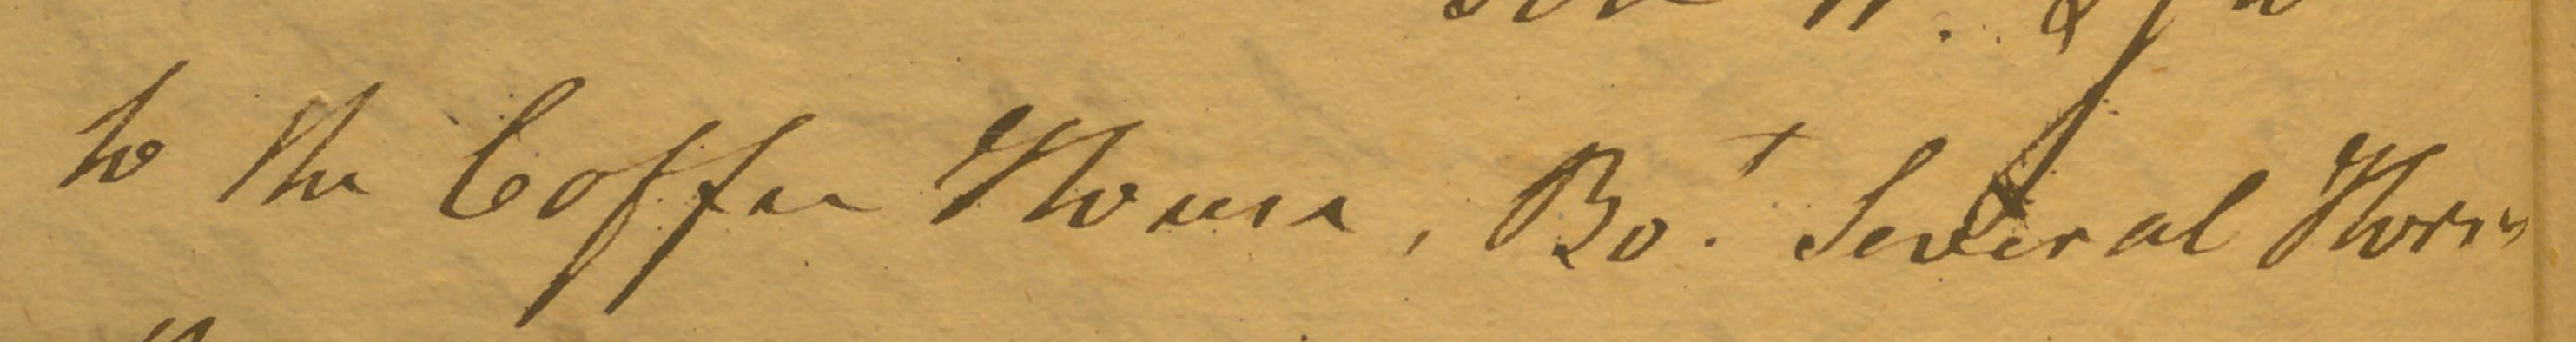to the Coffer House, Bo^t. Several Horses
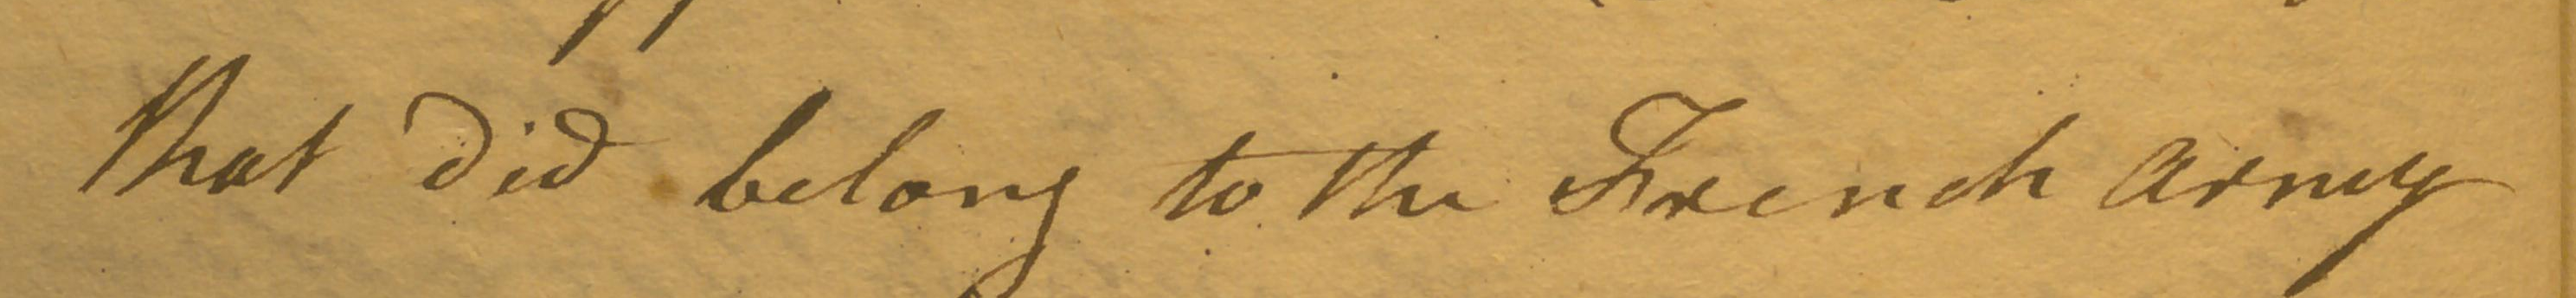that did belong to the French army
